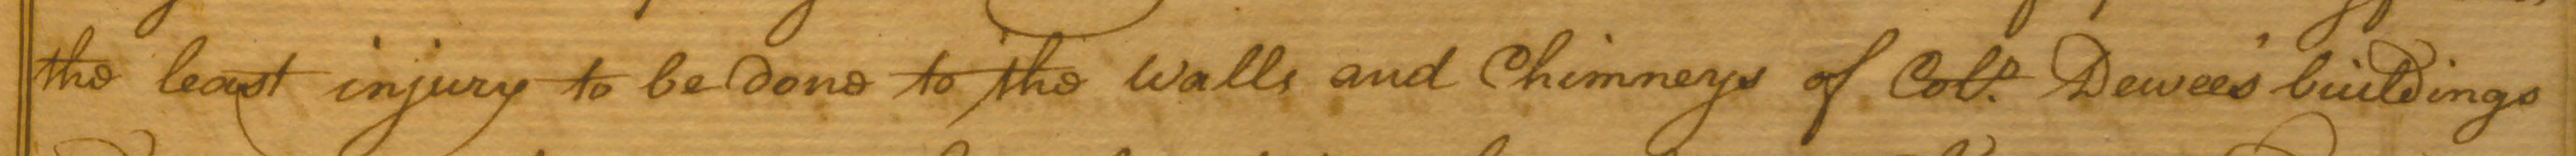the least injury to be done to the Walls and Chimneys of Col^o. Dewees' buildings
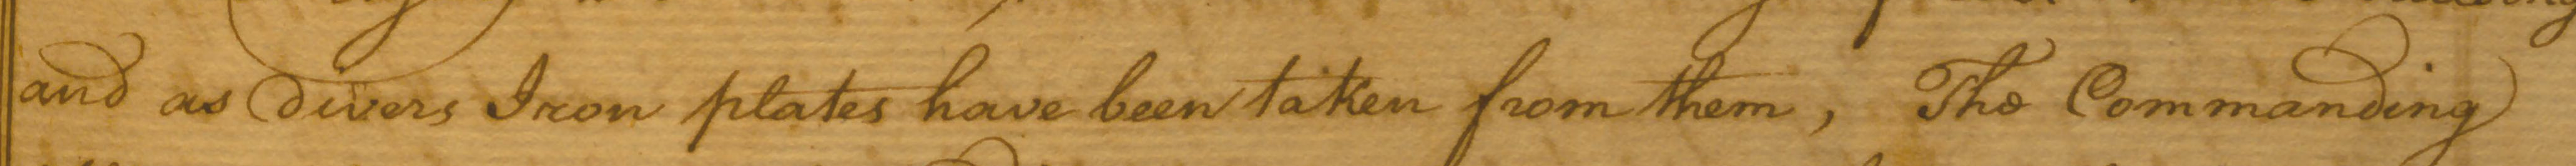and as divers Iron plates have been taken from them, The Commanding
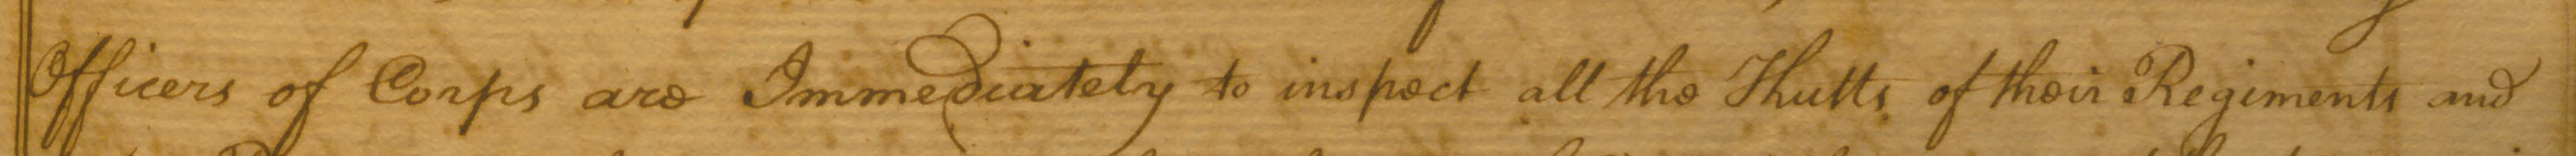Officers of Corps are Immediately to inspect all the Hutts of their Regiments and
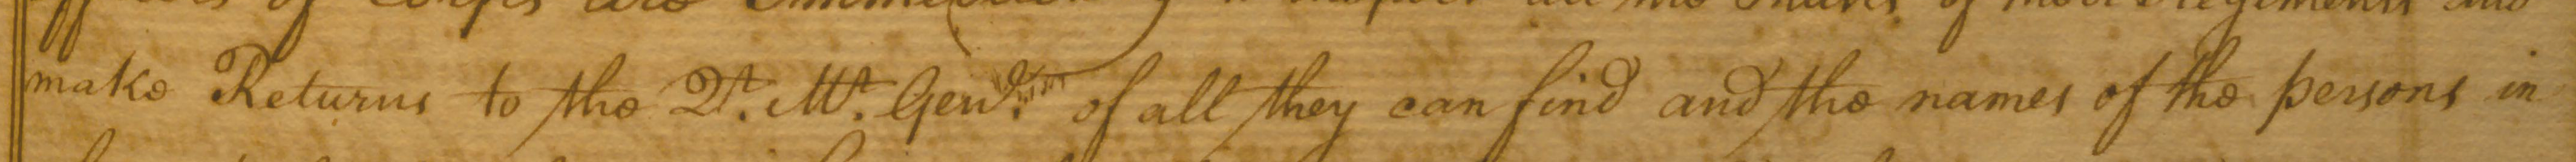make Returns to the Q^r. M^r. Gen^l. of all they can find and the names of the persons in
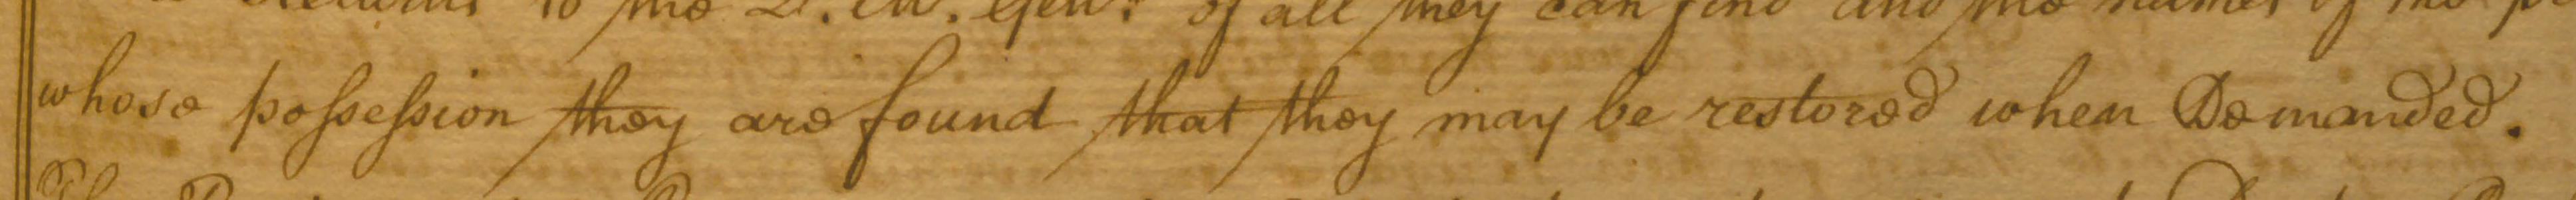whose possession they are found that they may be restored when Demanded.
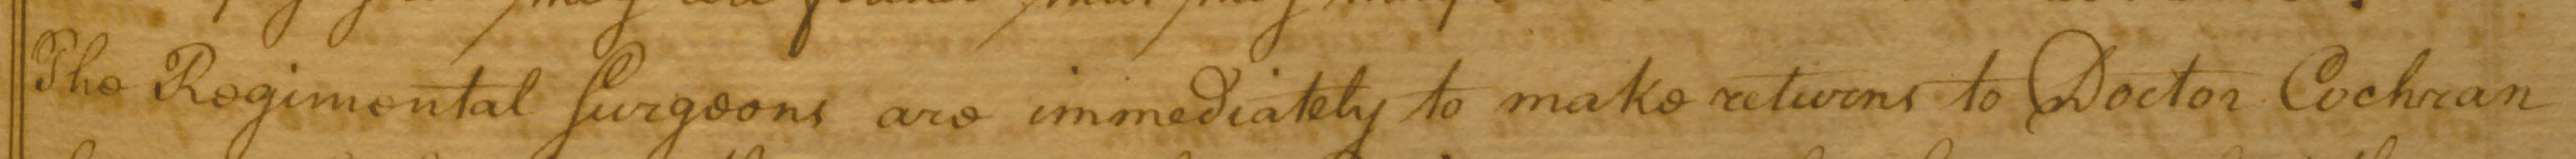The Regimental Surgeons are immediately to make returns to Doctor Cochran
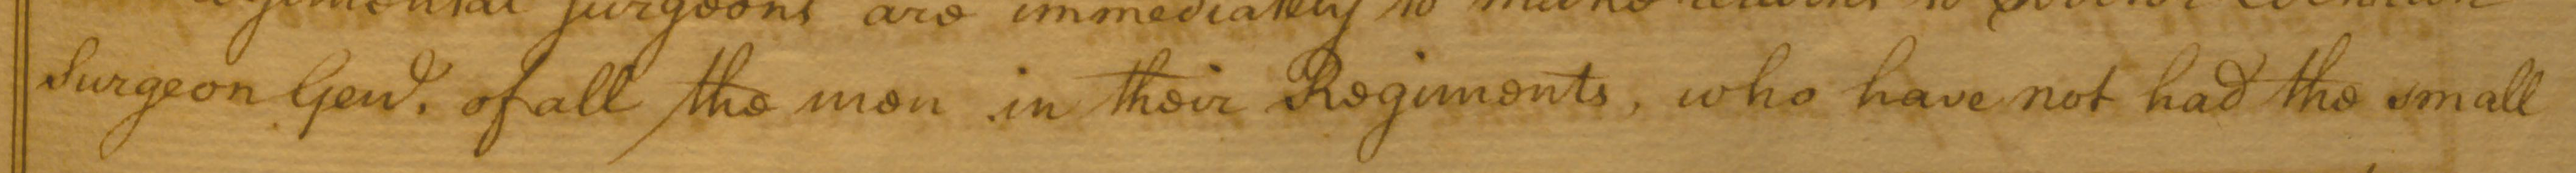Surgeon Gen^l. of all the men in their Regiments who have not had the small
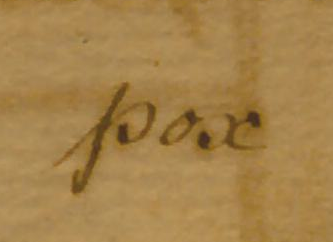pox
